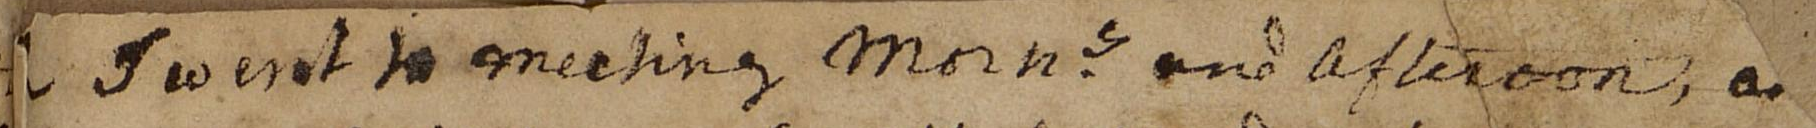I went to meeting morn^g and Afternoon, as
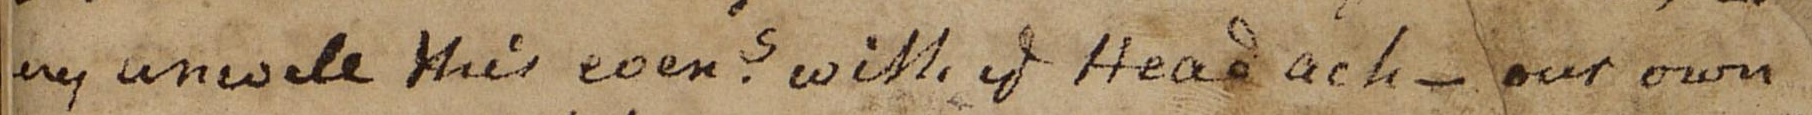my unwell this even^g with y^e Head ach- our own
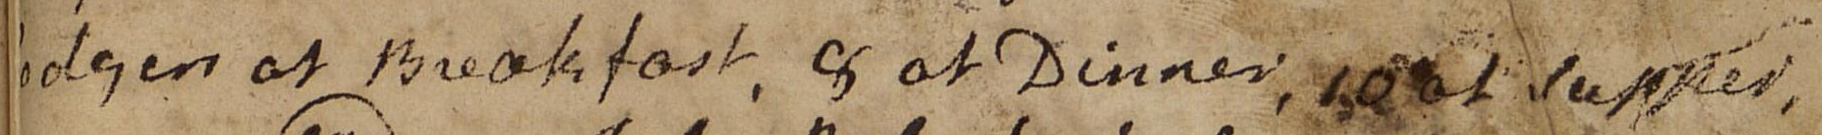lodgers at Breakfast, 8 at Dinner, 10 at Supper,
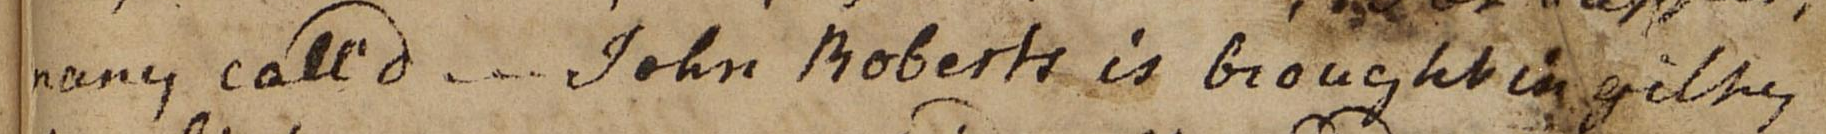many call'd-- John Roberts is brought in gilty
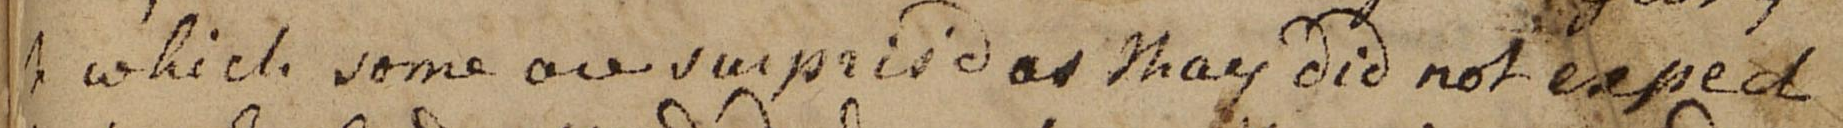which some are surpris'd as thay did not expect
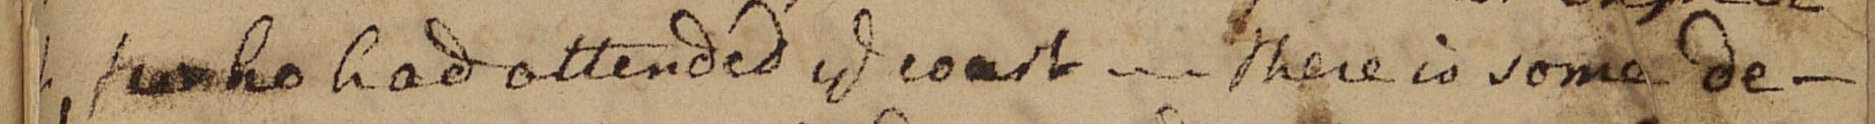t, who had attended y^e coast- there is some de-
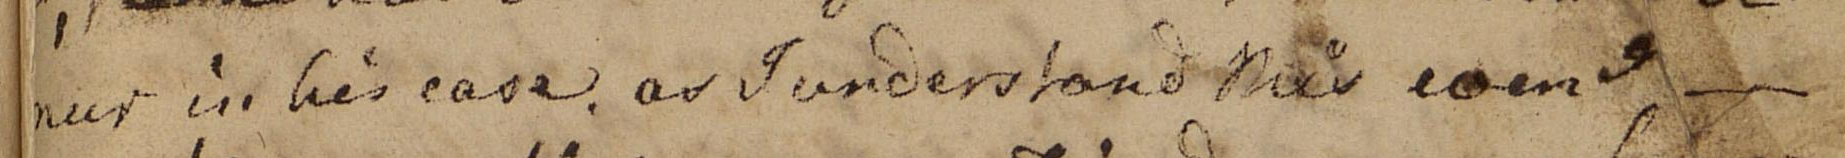nur in his case, as I understand this even^g-
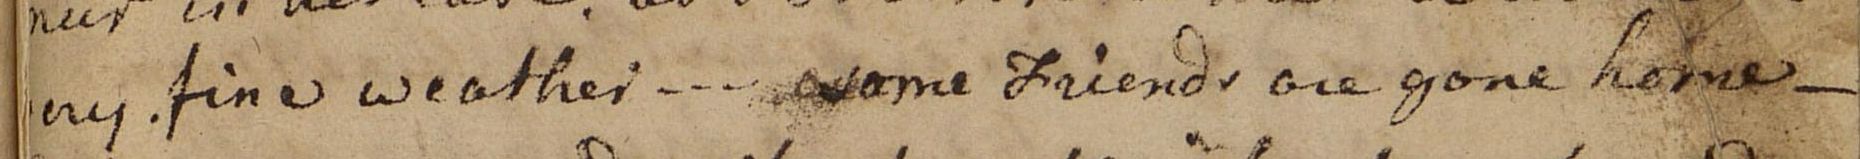ery fine weather- same Friends are gone home-
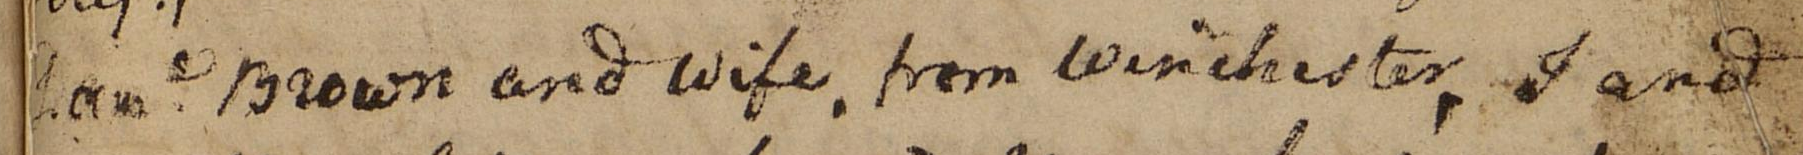Sam^l. Brown and wife, from Winchester, I and
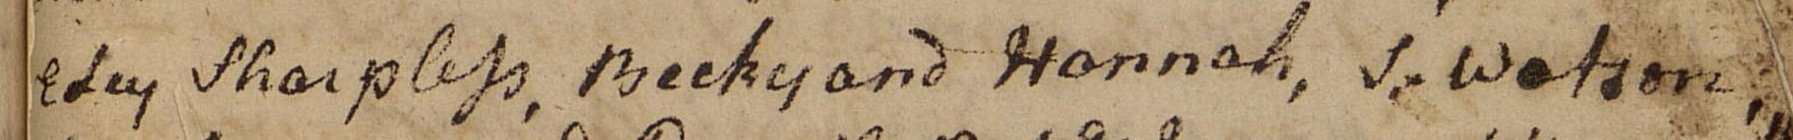Edey Sharpless Becky and Hannah, S. Watson,
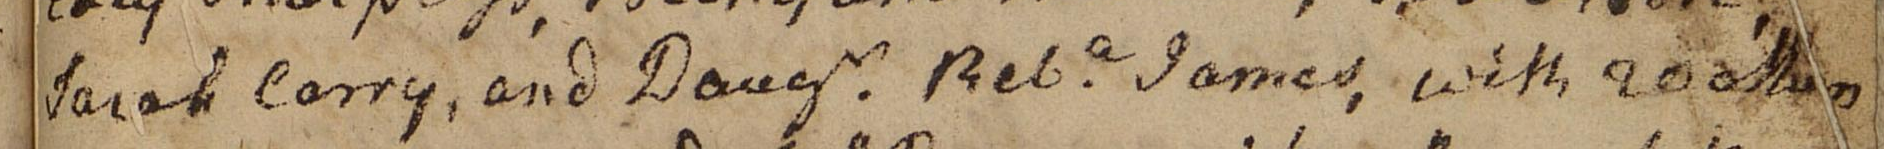Sarah Carry, and Daug^r. Reb^a. James, with no others
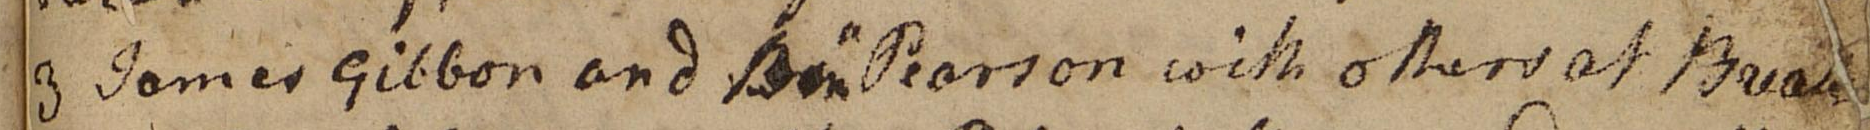3 James Gibbon and Bon^a Pearson with others at Break
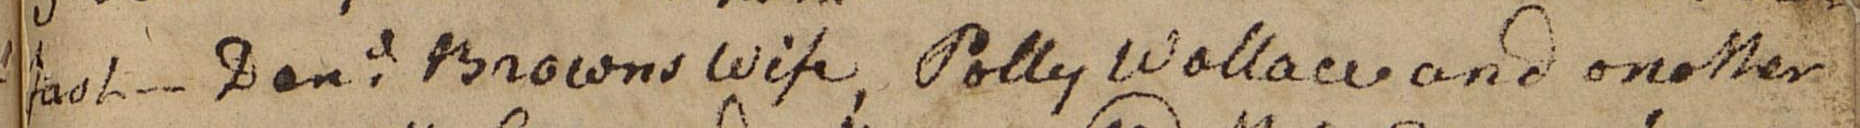fast- Dan^l Browns Wife, Polly Wallace and another
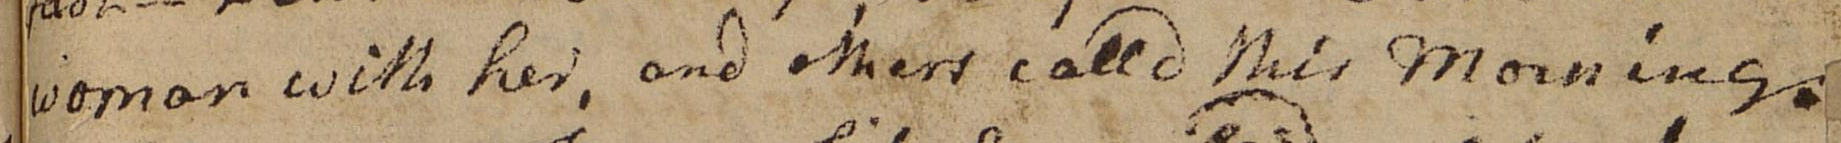woman with her, and others calld this morning.
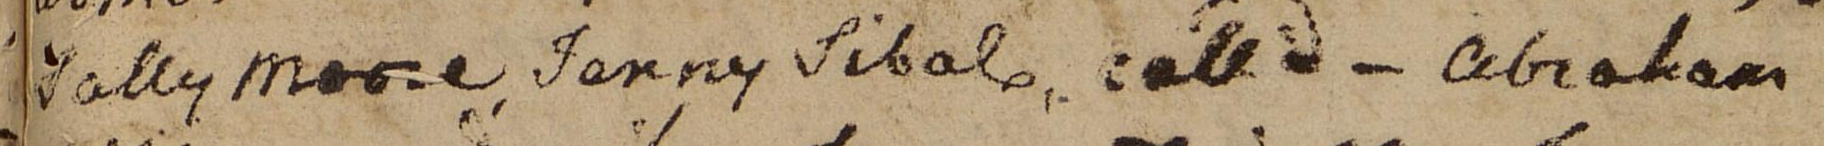Sally Moore, Janny Sibals, call'd- Abraham
